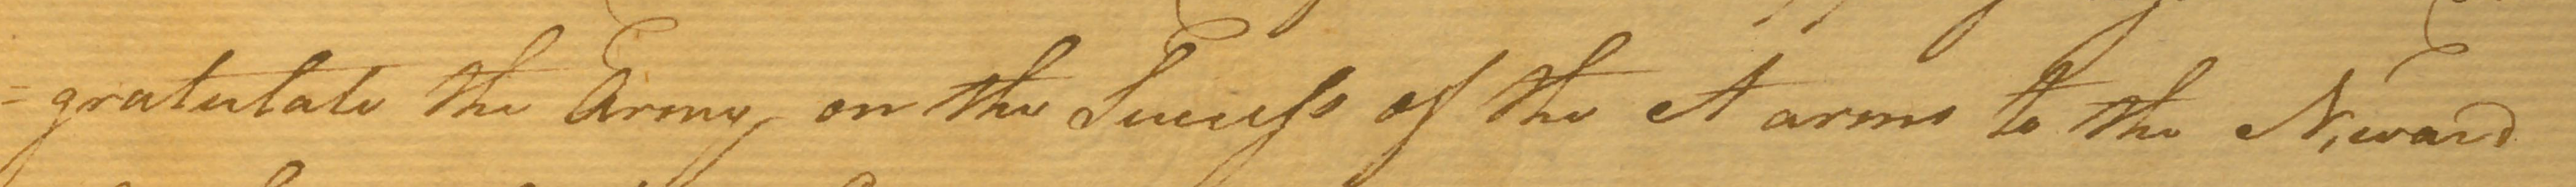gratulate the Army on the Success of the A arms to the Nward
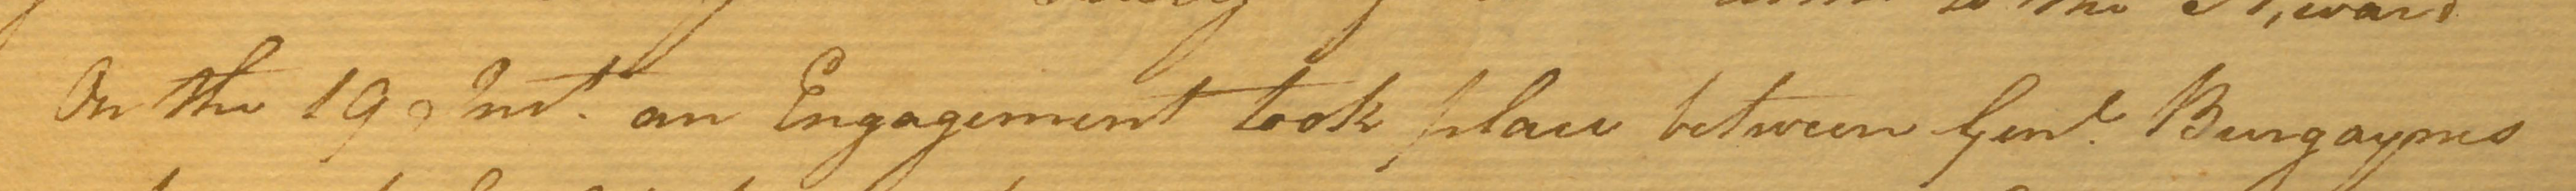On the 19 Ins^t. an Engagement took place between Gen^l. Burgoyns
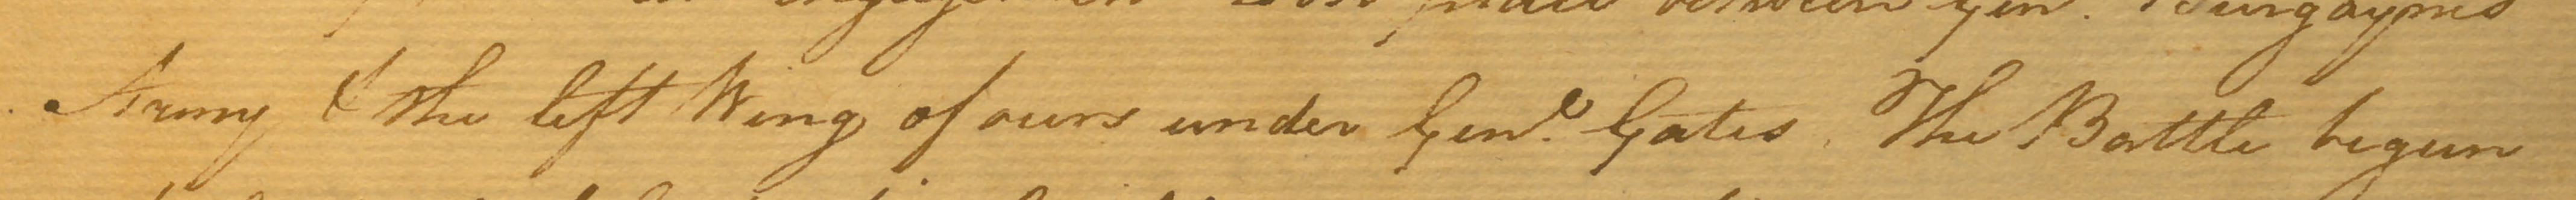Army & the left Wing of ours under Gen^l. Gates. The Battle begun
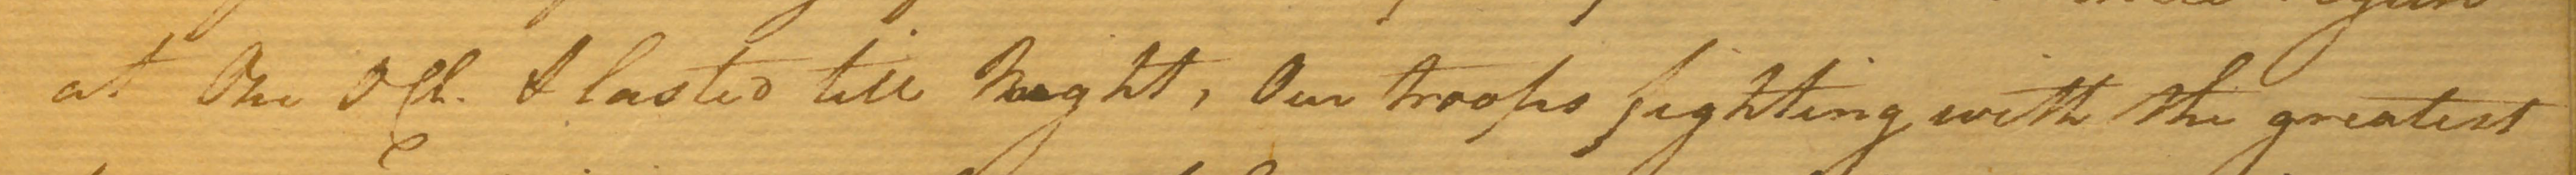at One OCl. & lasted till Night, Our troops fighting with the greatest
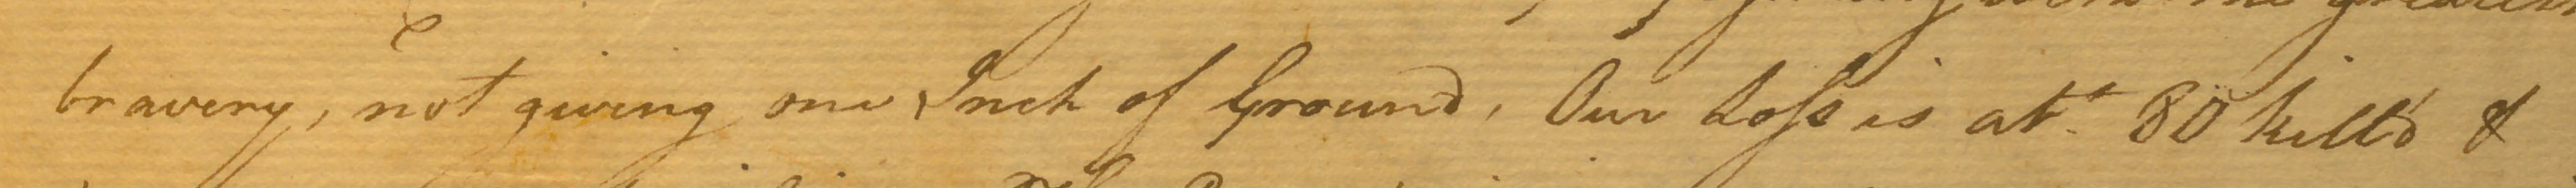bravery, not giving one Inch of Ground. Our loss is ab^t. 80 kill'd &
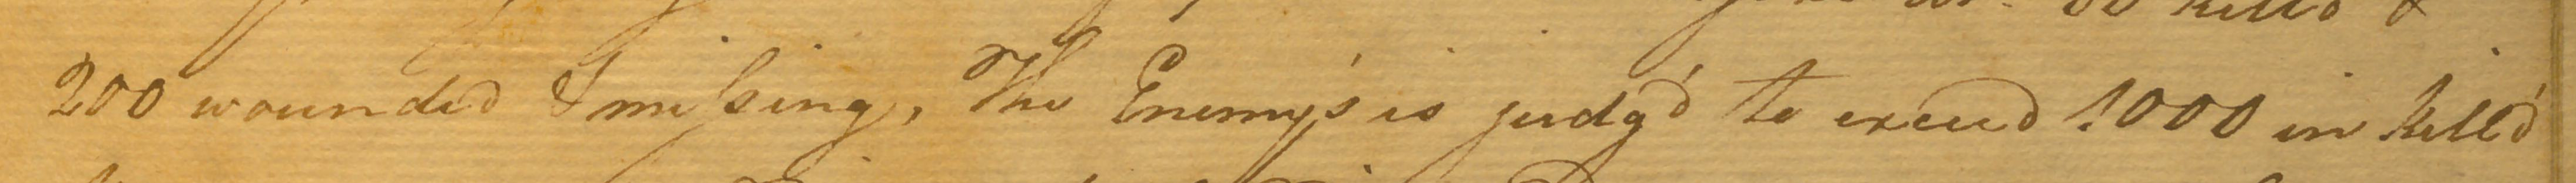200 wounded & missing. The Enemy's is judg'd to exceed 1000 in kill'd
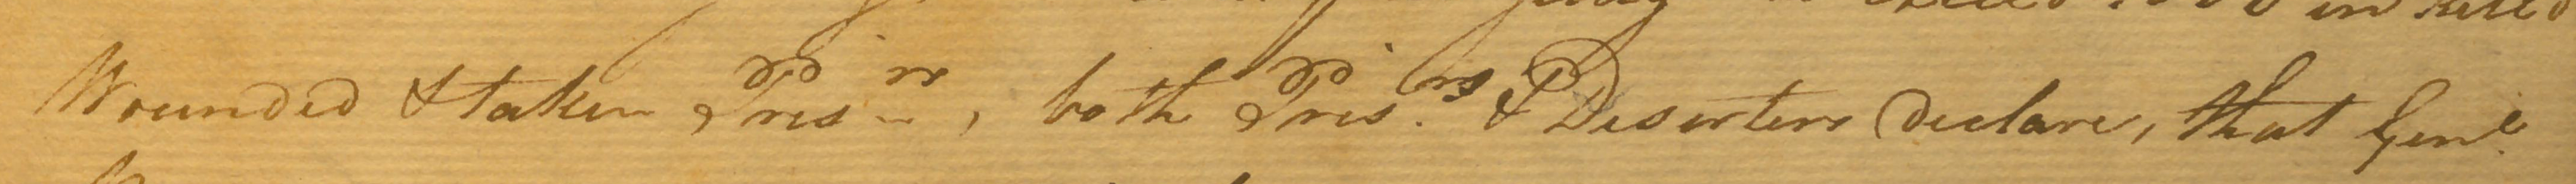Wounded & taken Pris^rs, both Pris^rs. & Deserters declare, that Gen^l.
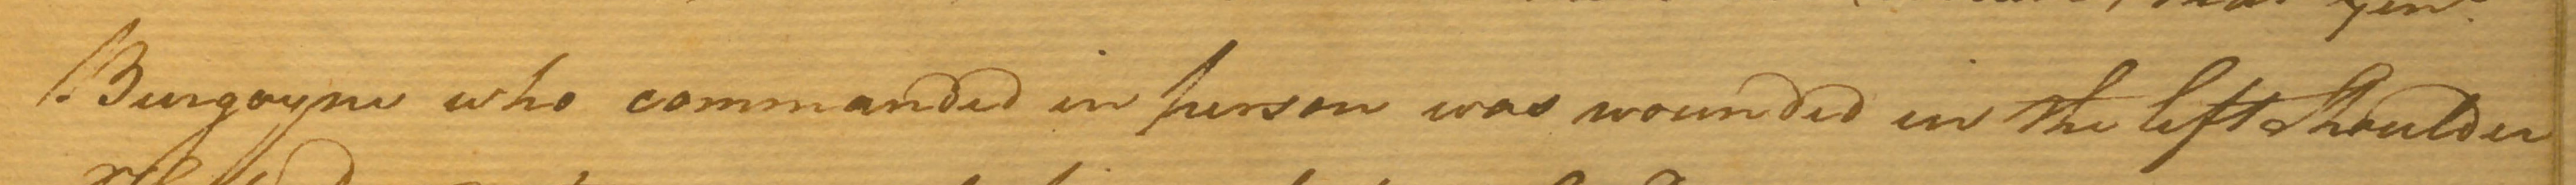Burgoyne who commanded in person was wounded in the left Shoulder
